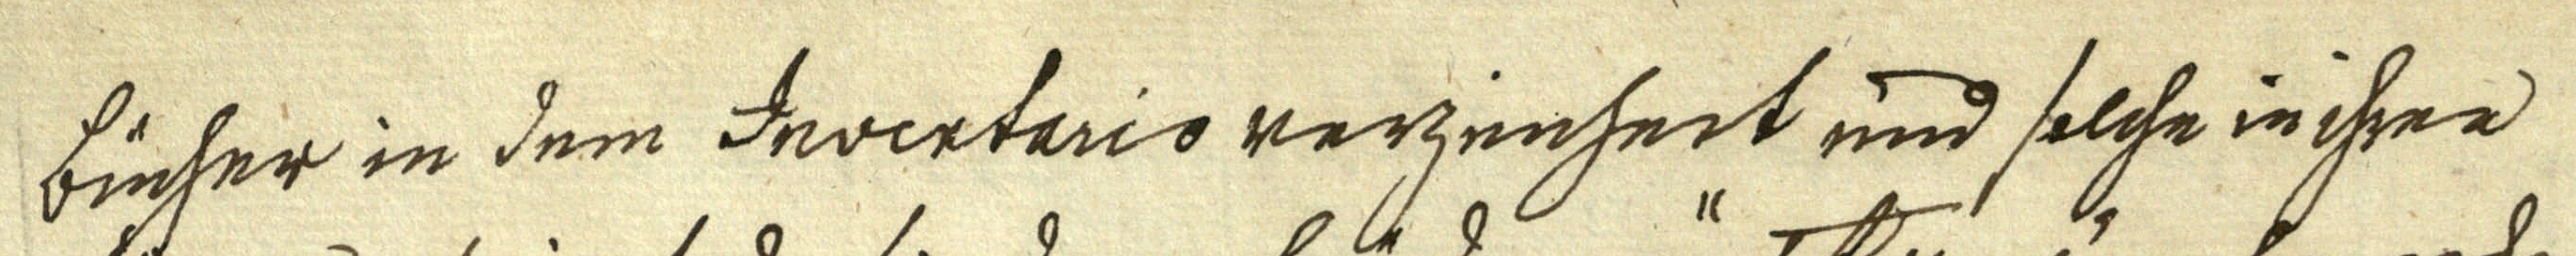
Bücher in dem Inventario verzeichnet und solche in ihren
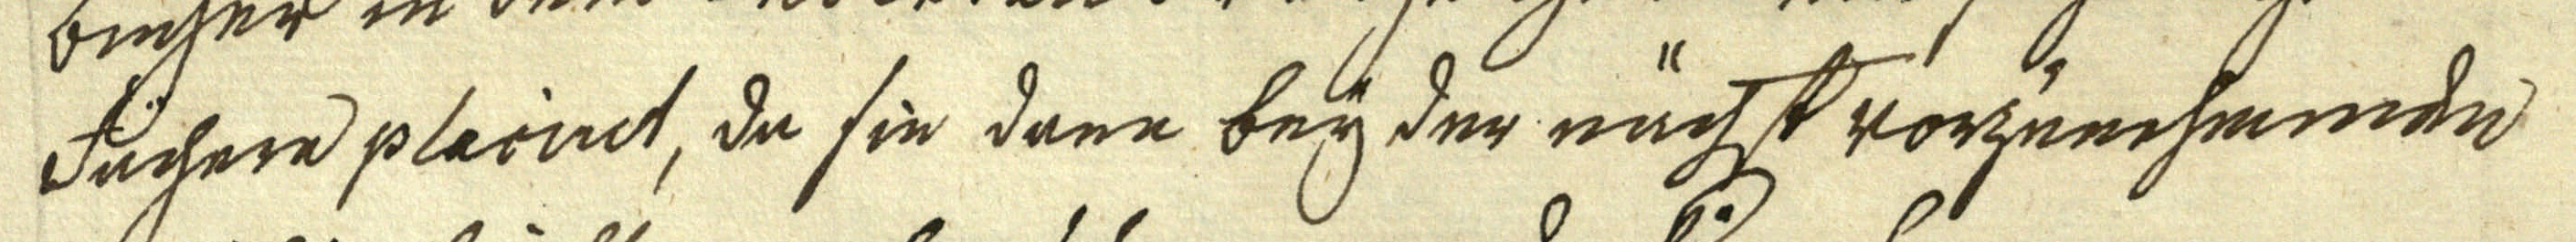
Fächern placiret, da sie dann beÿ der nicht vorzunehmenden
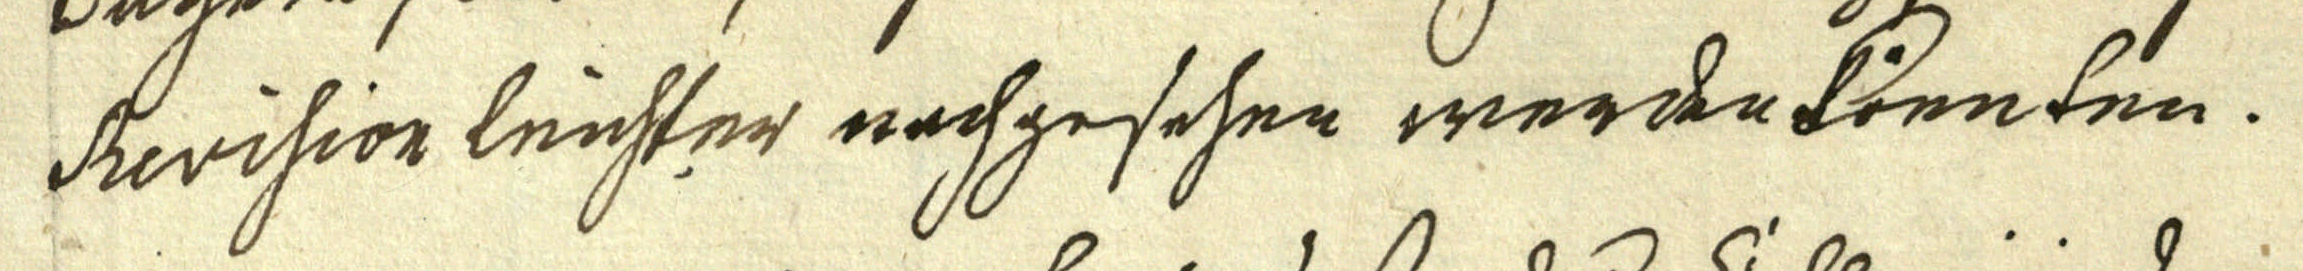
Revision leichter nachgesehen werden könnten.
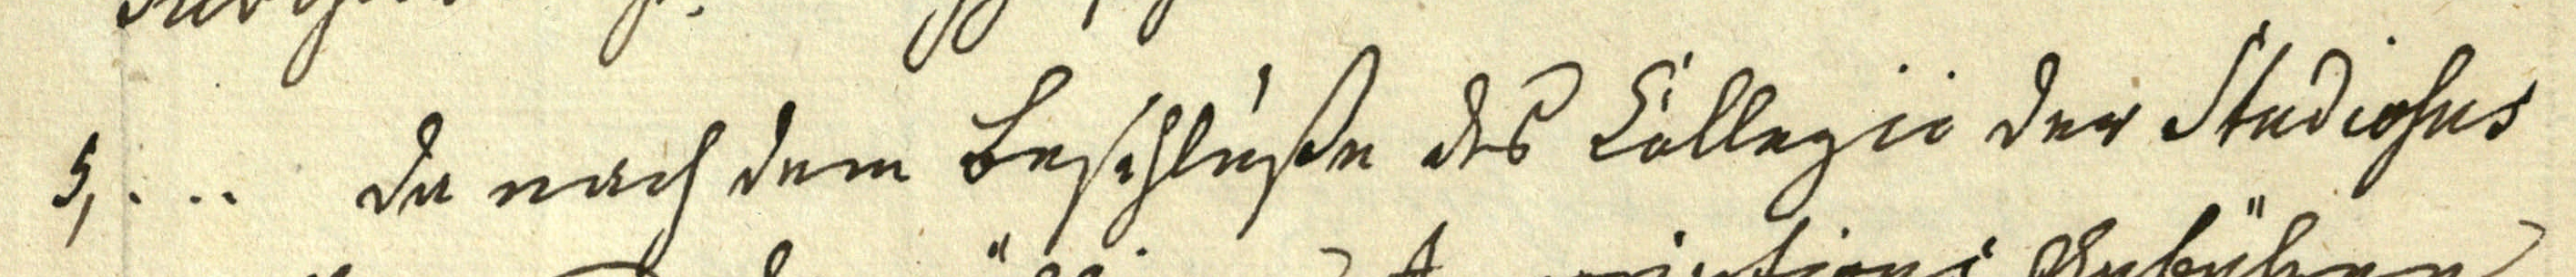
5. da nach dem Beschluße des Collegii der Studiosus
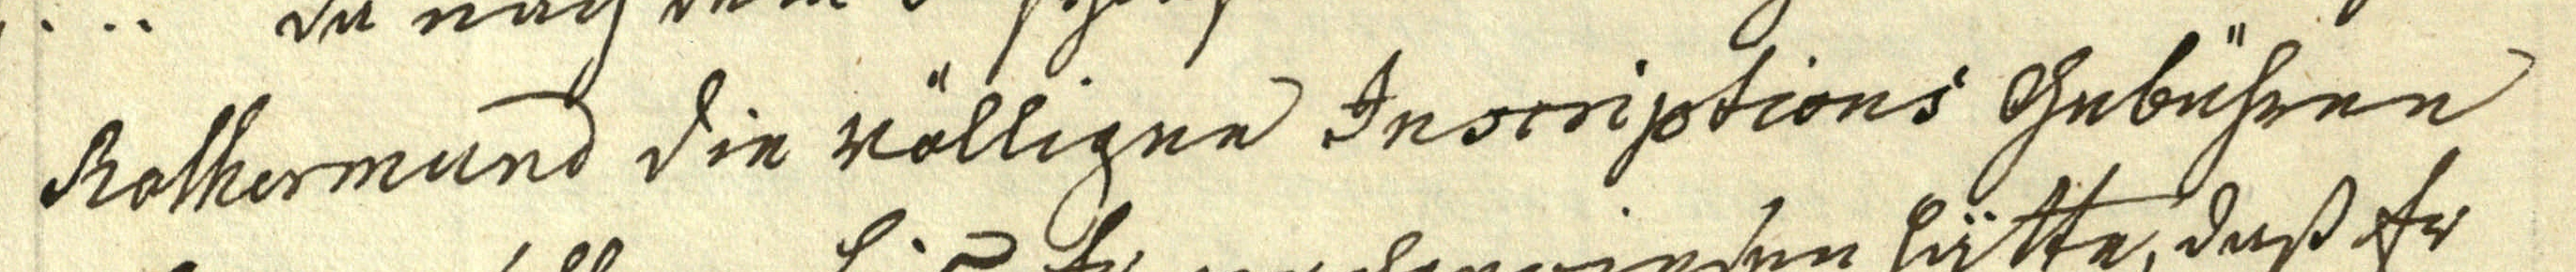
Rothermund die völligen Inscriptions Gebühren
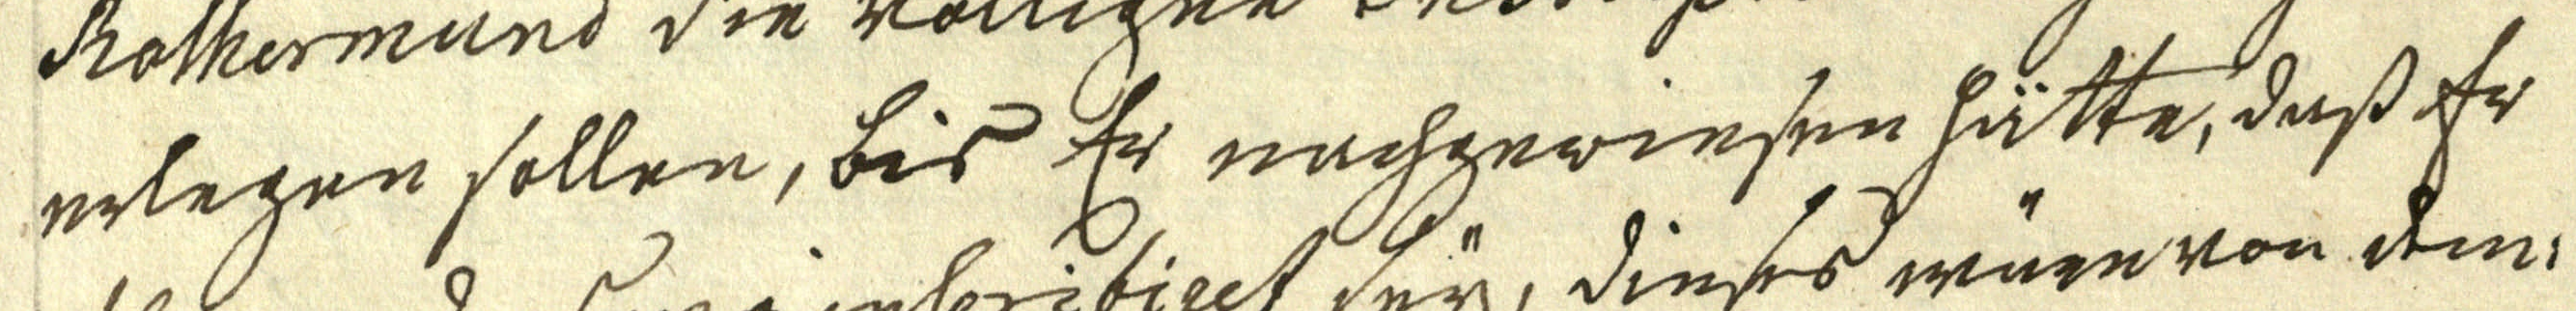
erlegen sollen, bis Er nachgewiesen hätte, daß Er
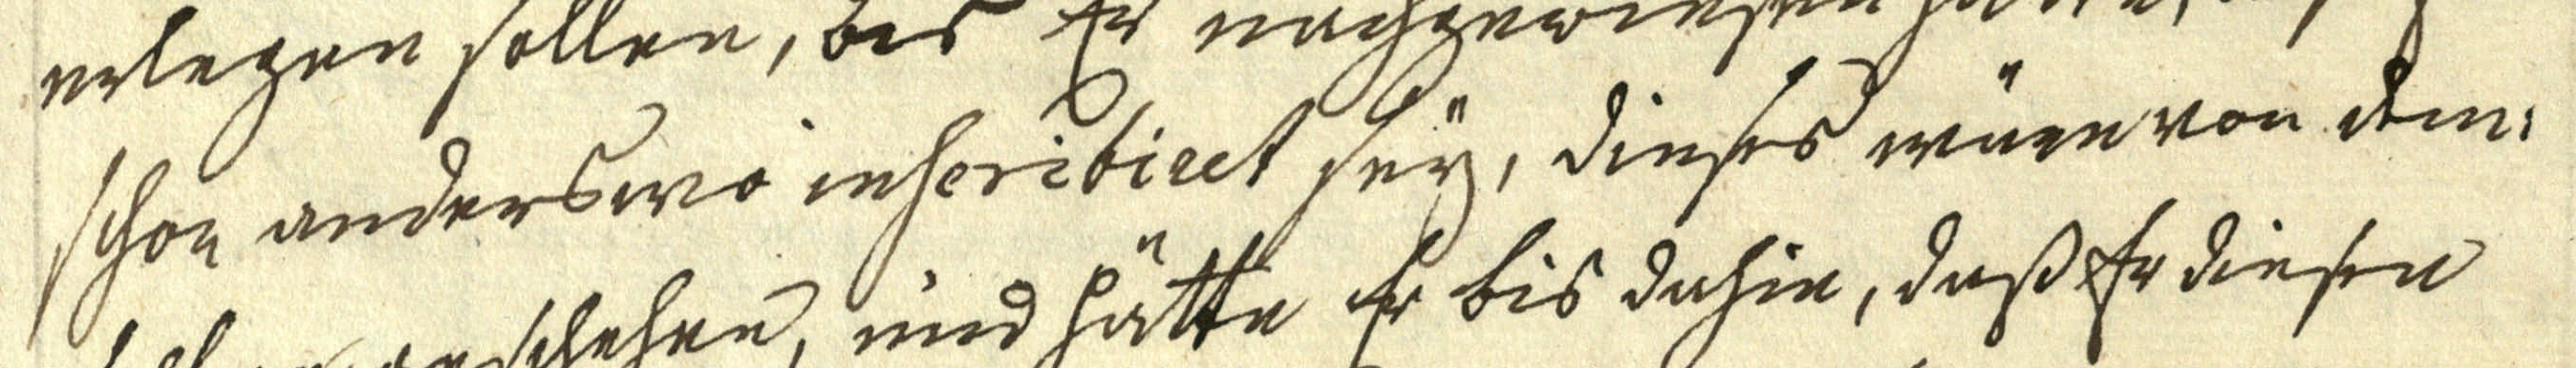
schon anderswo inscribiret seÿ, dieses wäre von dem¬
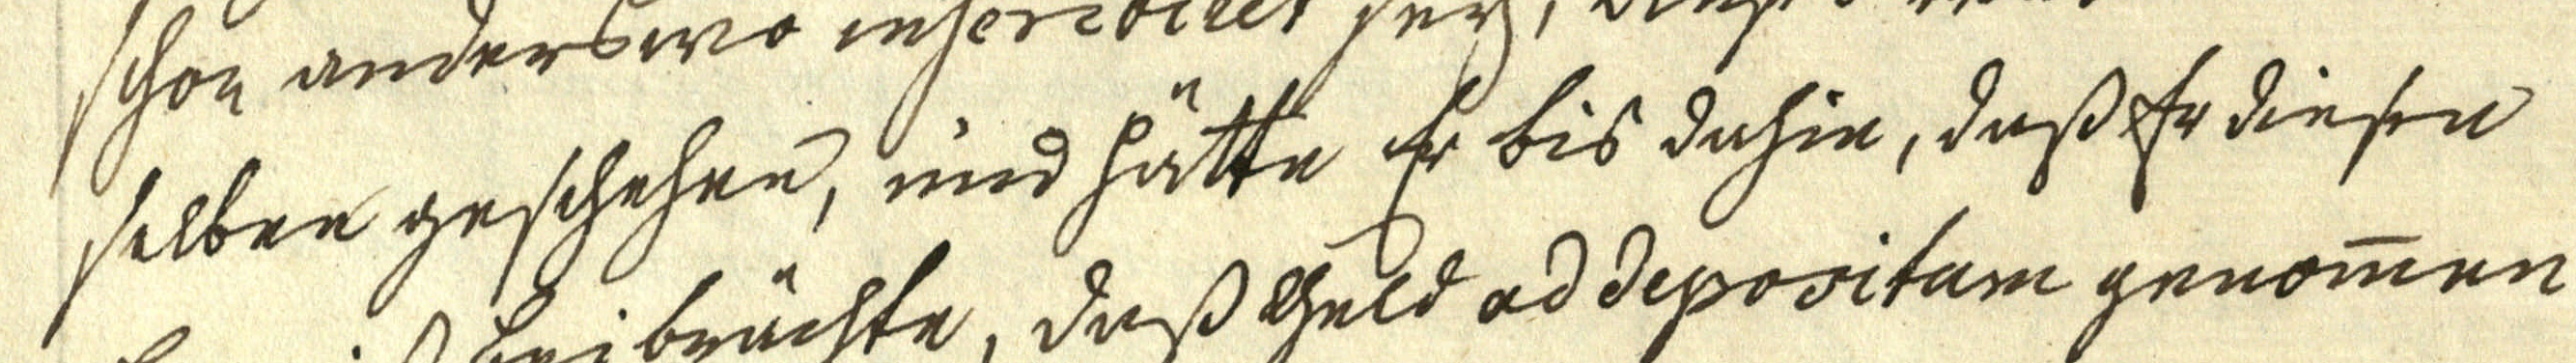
selben geschehen, und hätte Er bis dahin, daß Er diesen
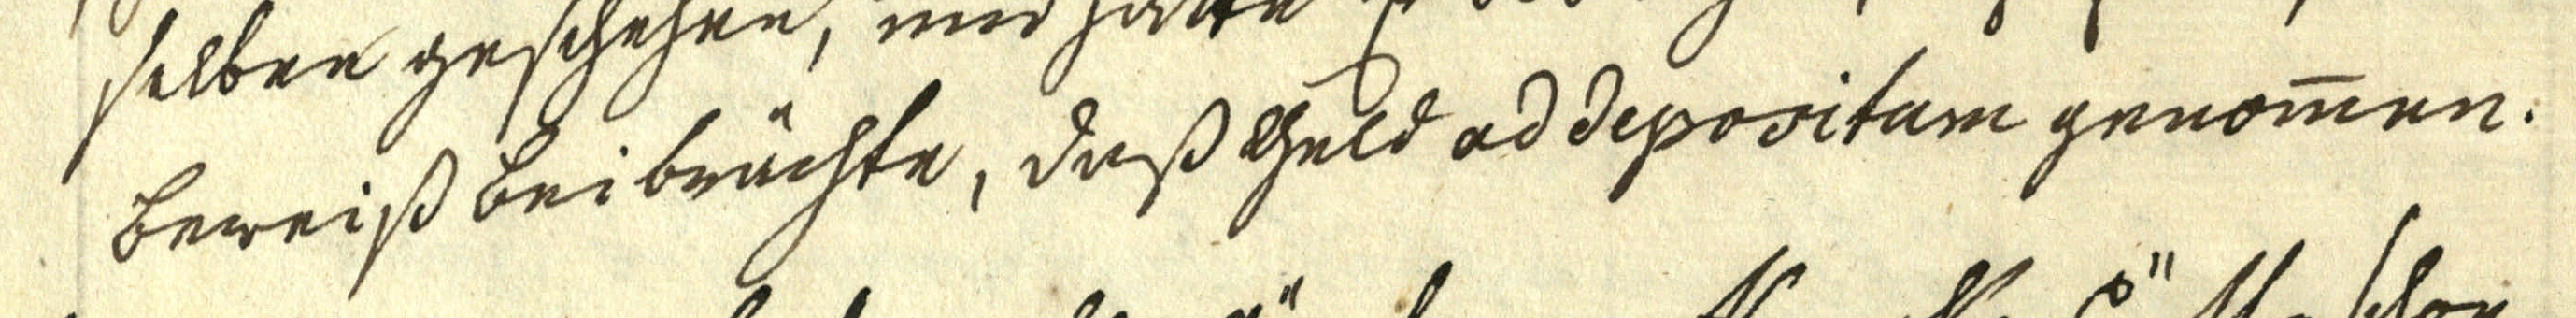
Beweis beibrächte, daß Geld ad depositum genomen.
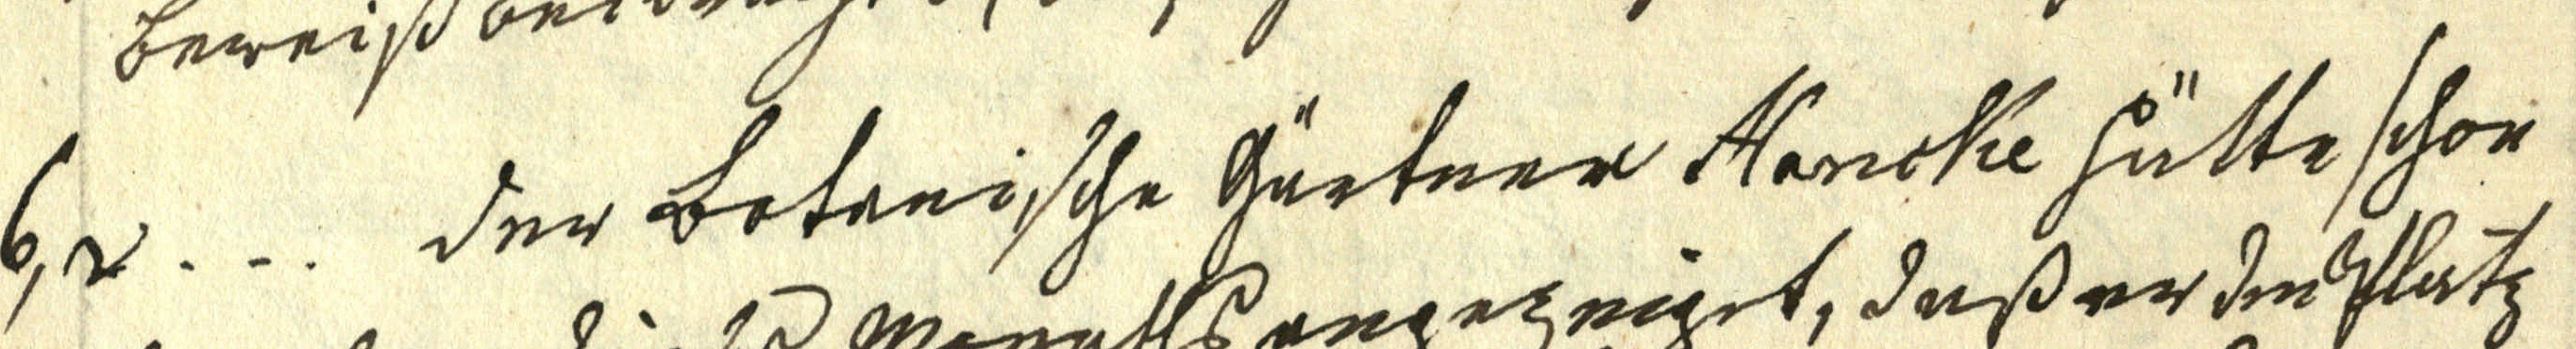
6. der Botanische Gärtner Hancke hätte schon
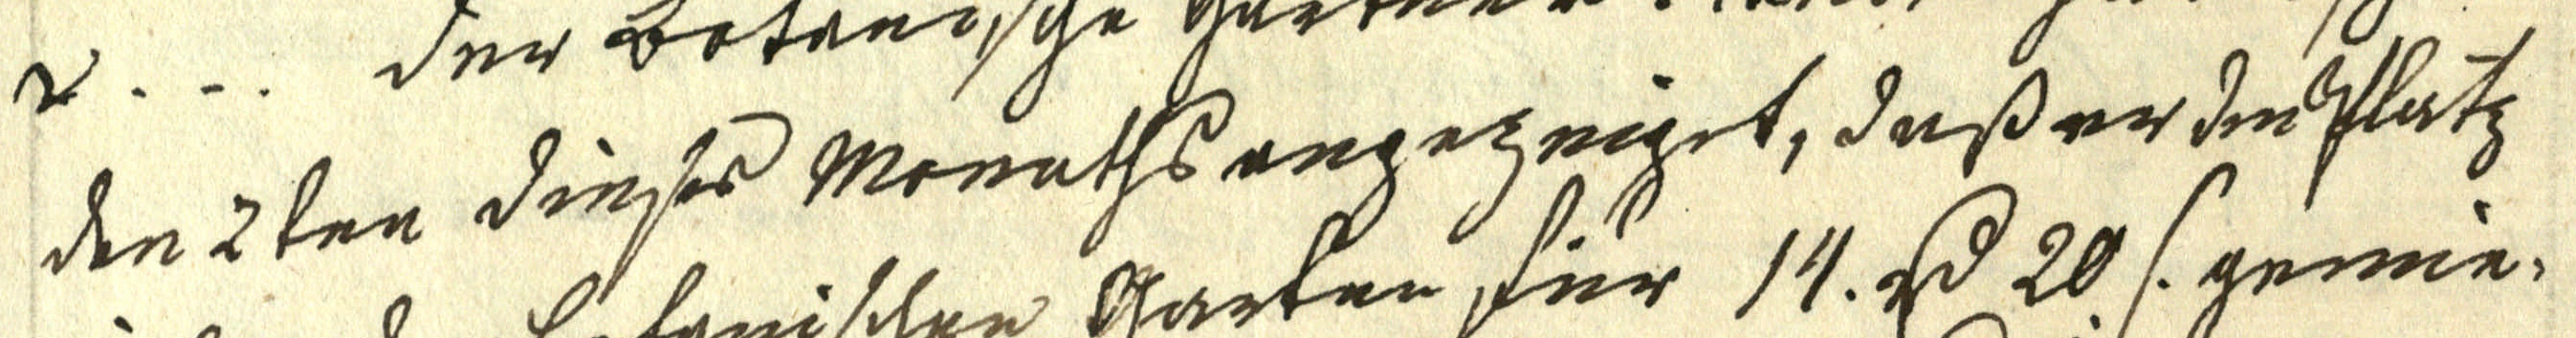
den 2 ten dieses Monaths angezeiget, daß er den Platz
